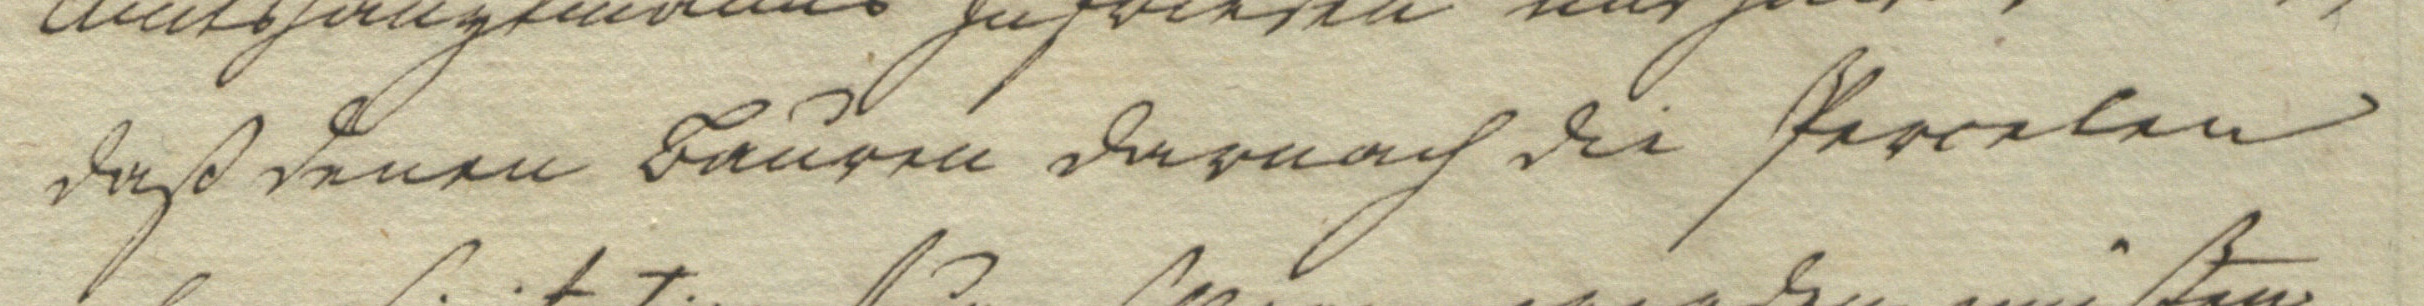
daß denen Bauren darnach die Percelen
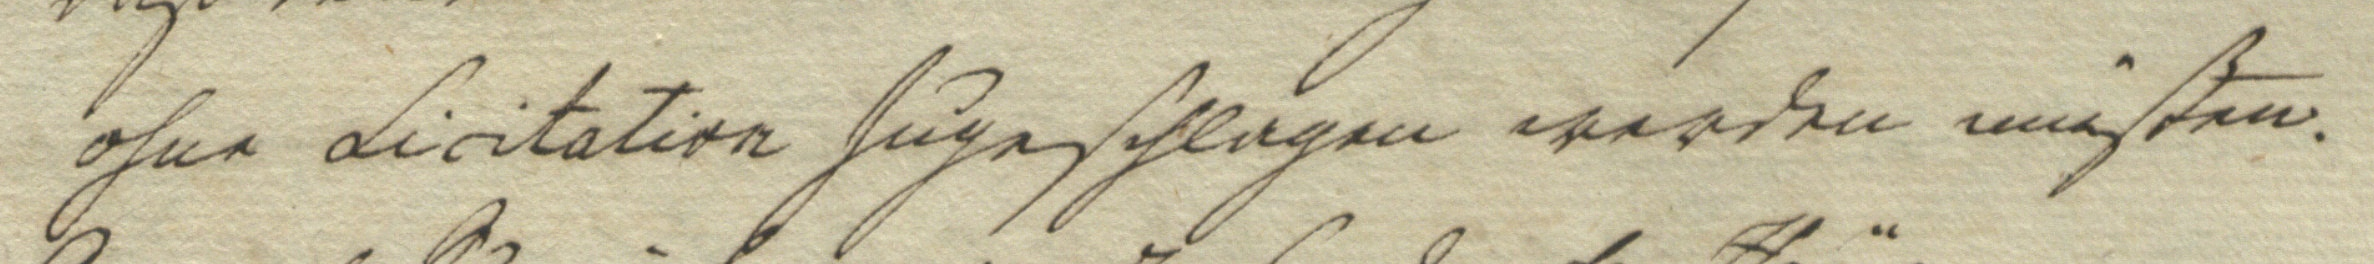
ohne Licitation zugeschlagen werden müßten.
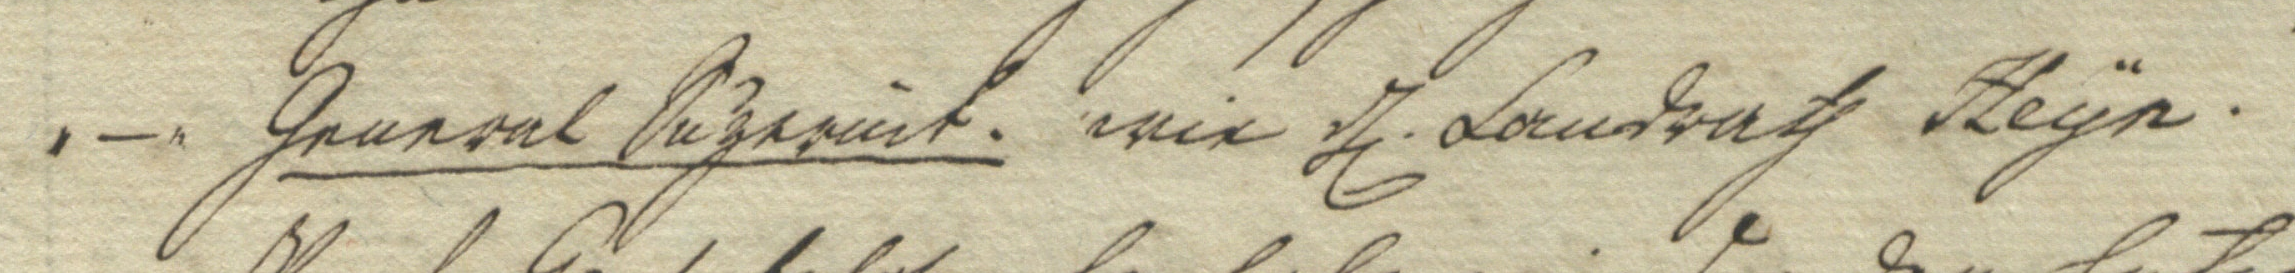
"- " General Superint. wie dh. Landrath Heyn.
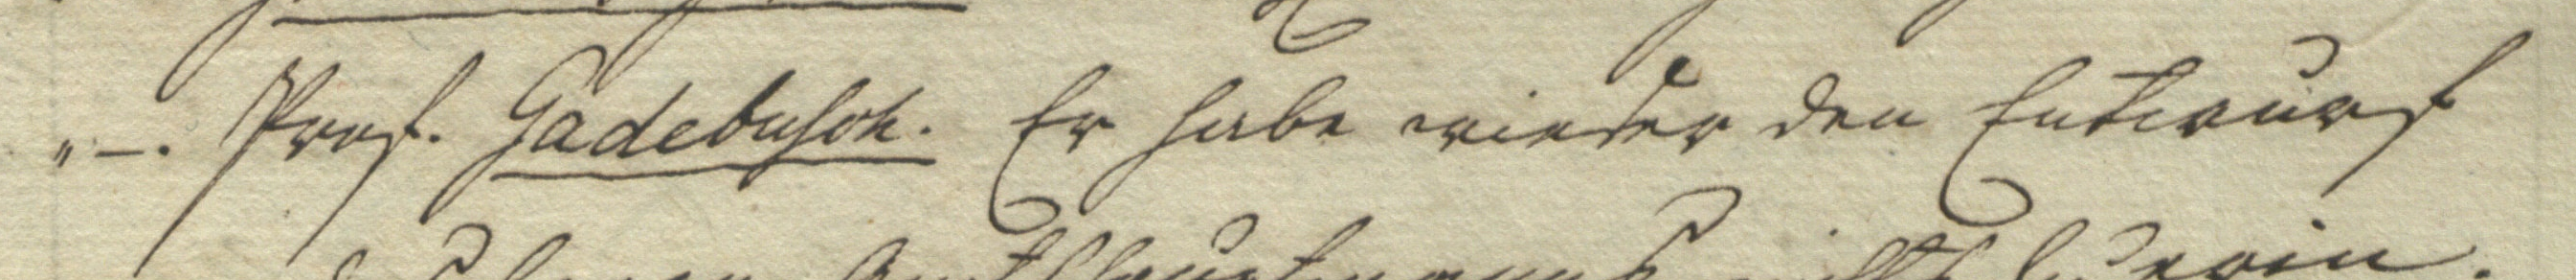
" - " Prof. Gadebusch. Er haben wieder den Entwurf
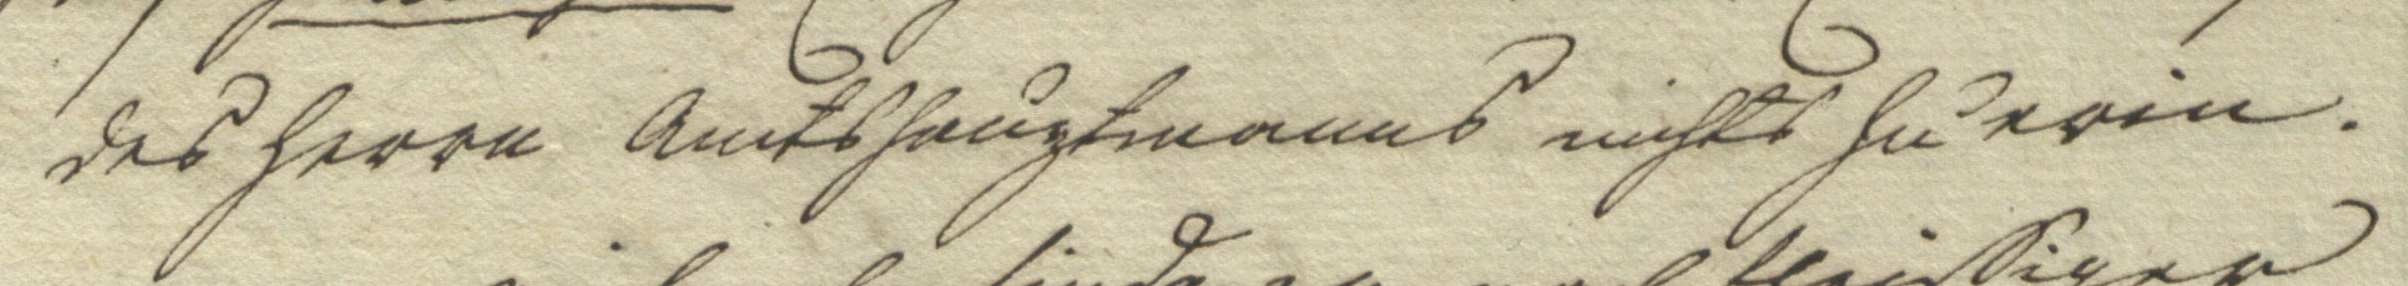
des Herrn Amtshauptmanns nichts zu erin¬
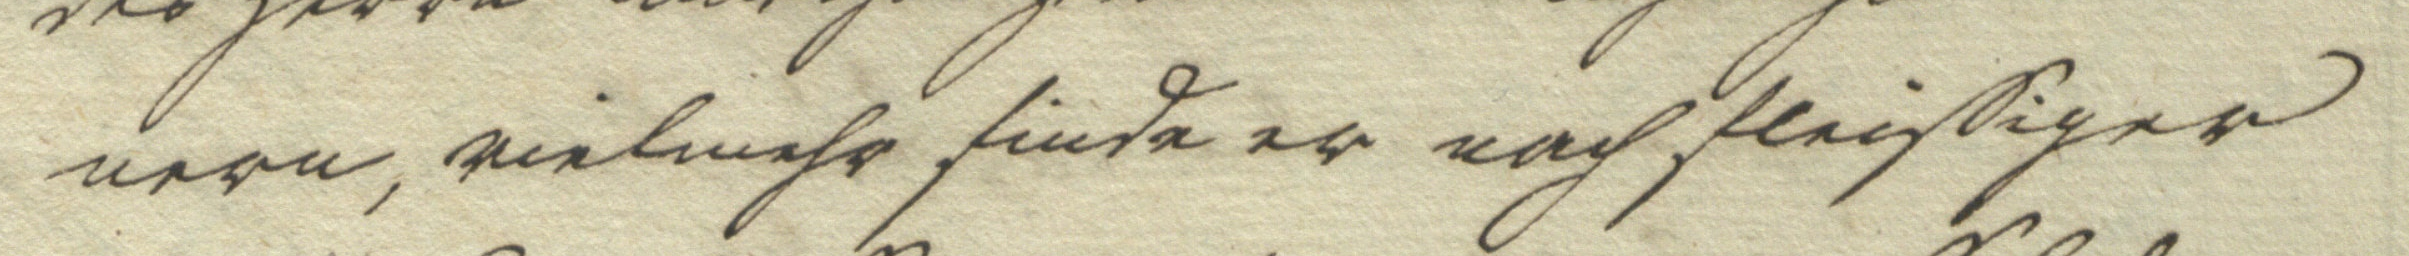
nern, vielmehr finde er nach fleissiger
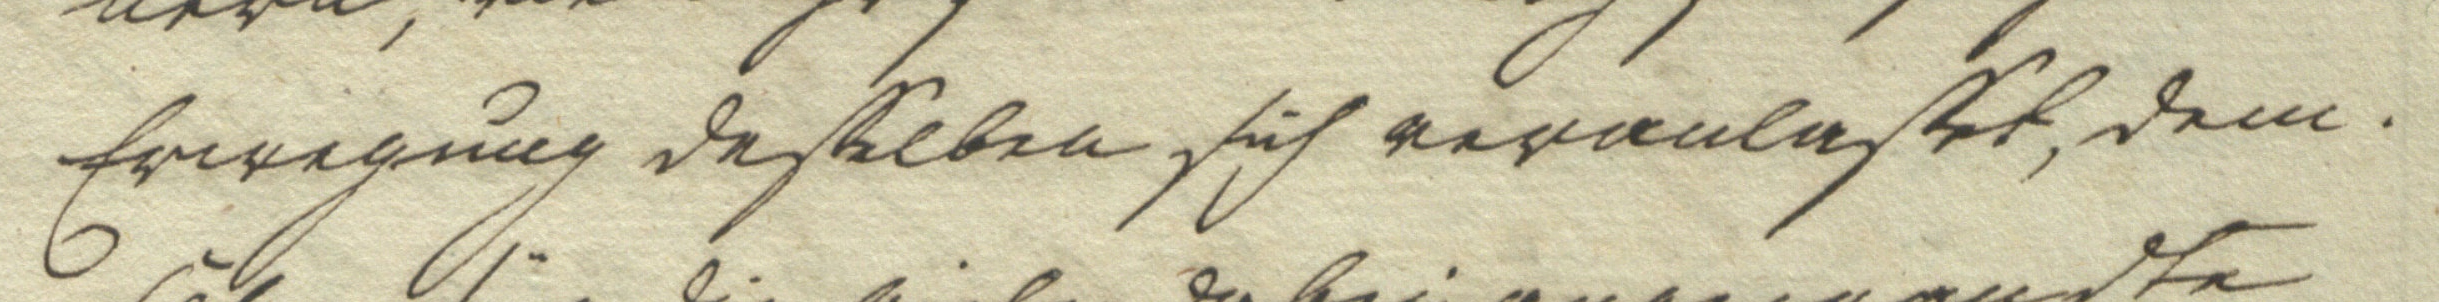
Erwegung desselben sich veranlasset, dem
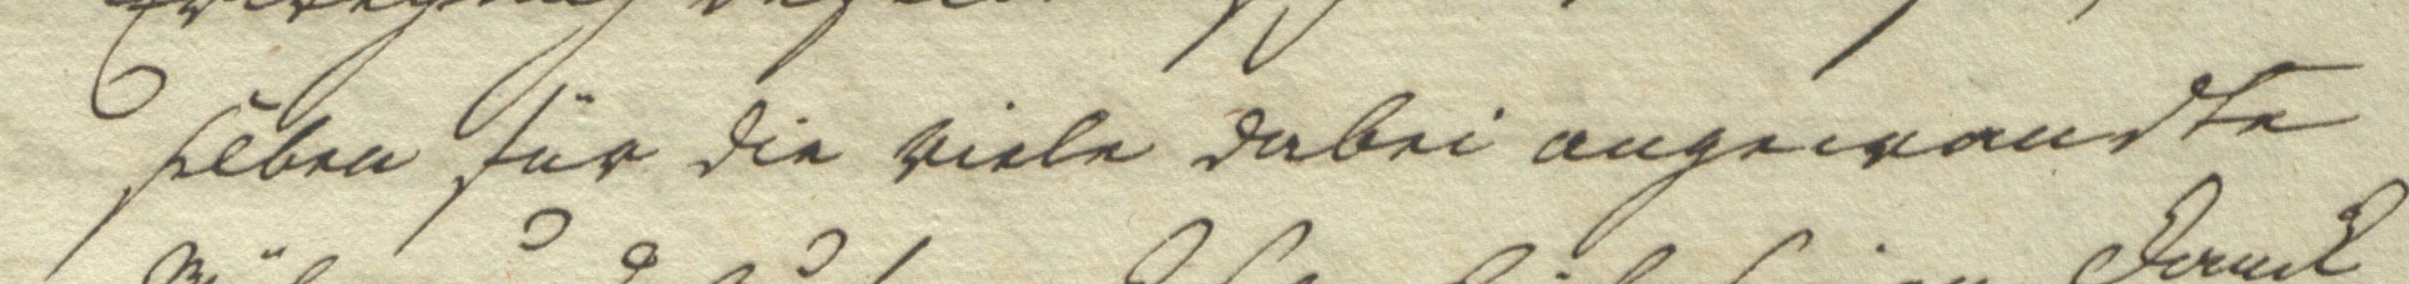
selben für die vielen dabei angewandte
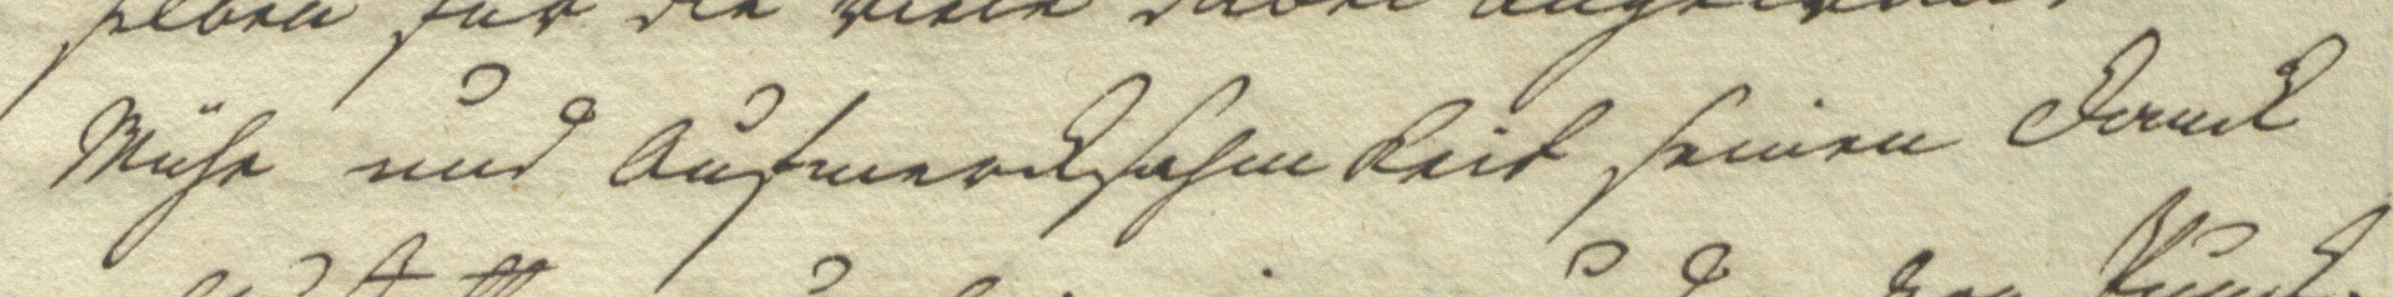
Mühe und Aufmerksahmkeit seinen Dank
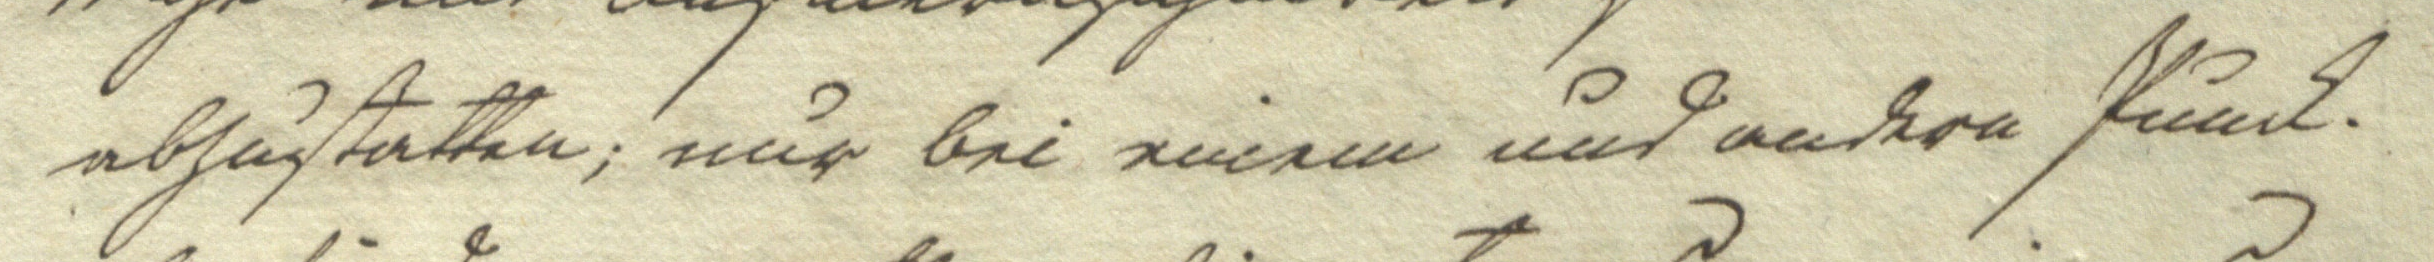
abzustatten; nur bei einem und andern Punk¬
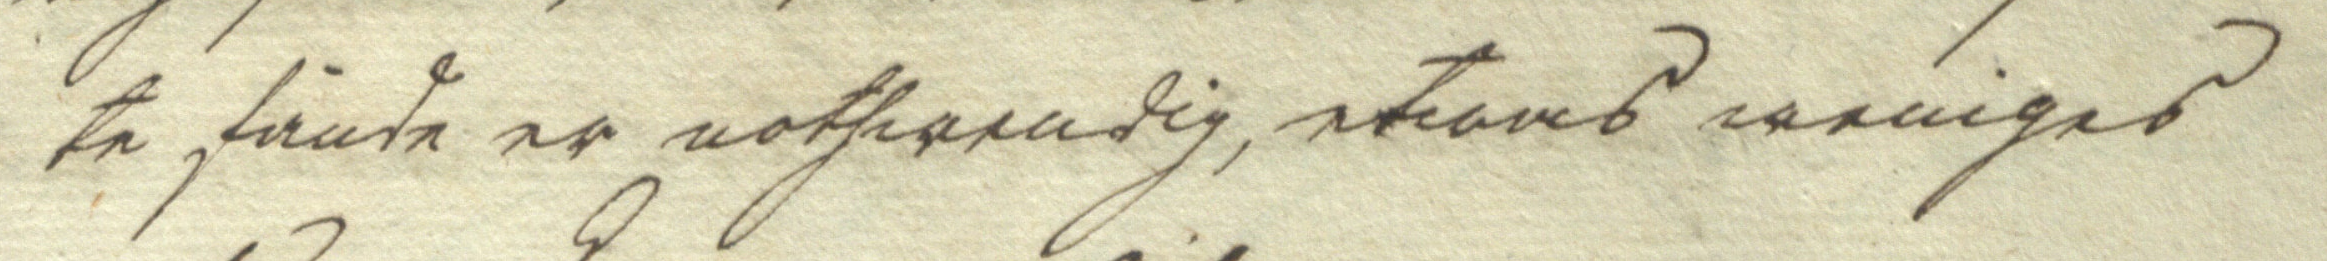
te fände er nothwendig, etwas weniges
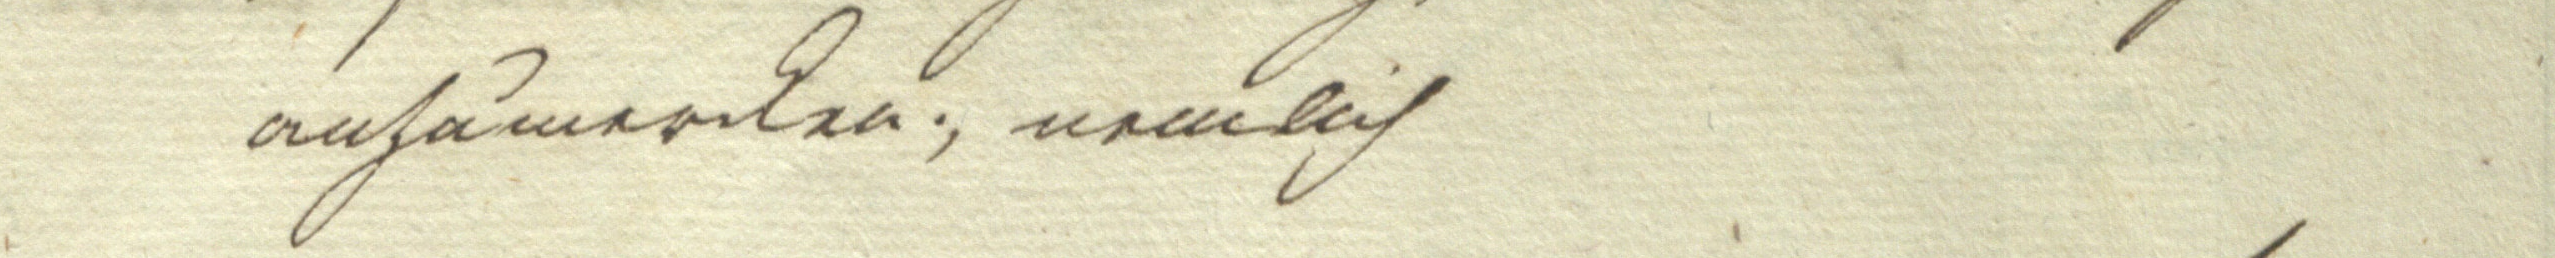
anzumerken; nemlich
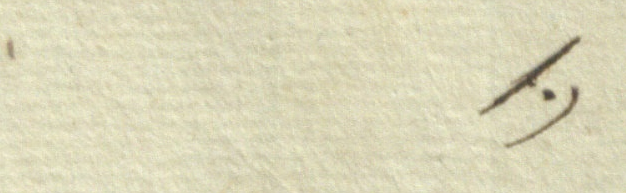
1.,
